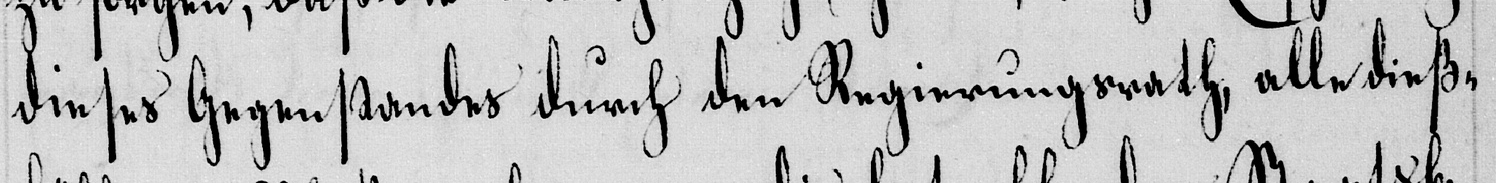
dieses Gegenstandes durch den Regierungsrath, alle dieß¬
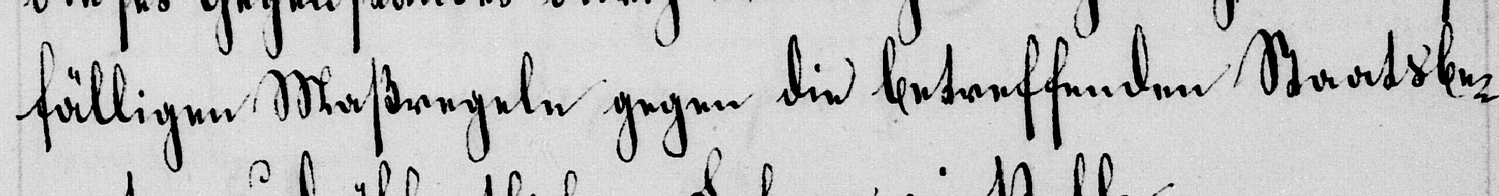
fälligen Maßregeln gegen die betreffenden Staatsbe¬
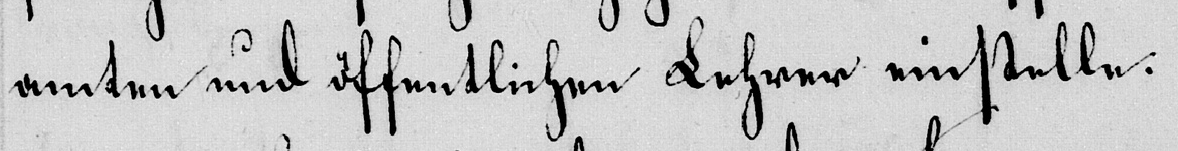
amten und öffentlichen Lehrer einstelle.
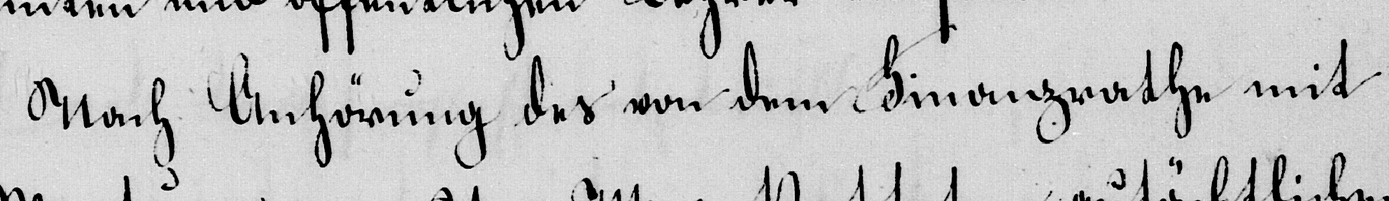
Nach Anhörung des von dem Finanzrathe mit
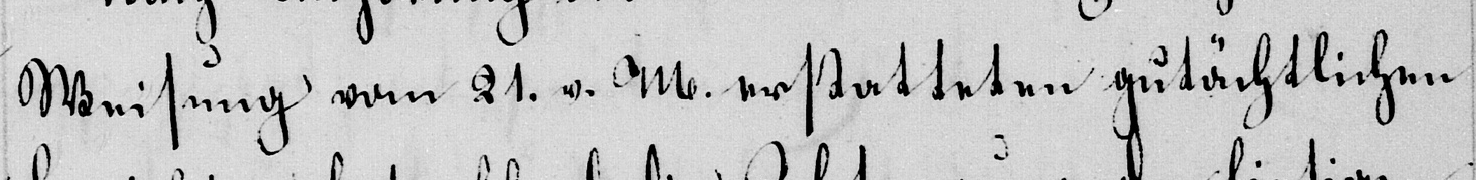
Weisung vom 21. v. M. erstatteten gutächtlichen
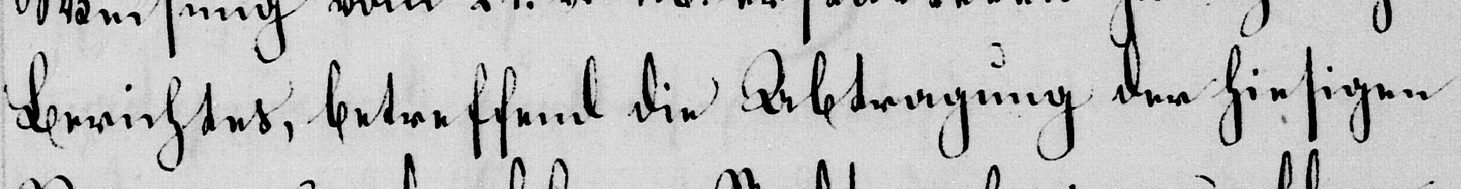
Berichtes, betreffend die Abtragung der hiesigen
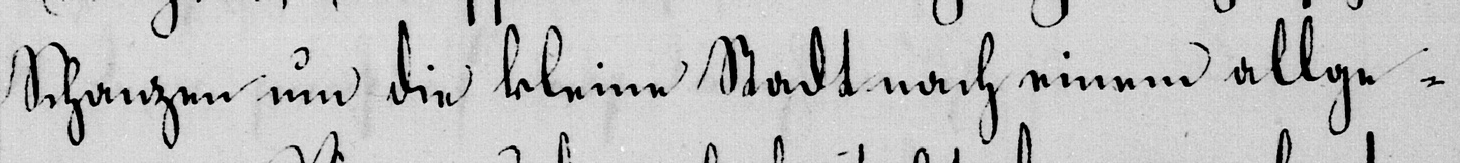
Schanzen um die kleine Stadt nach einem allge¬
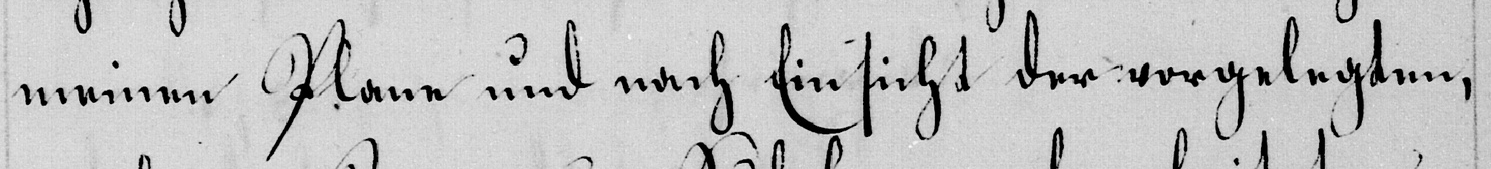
meinen Plane und nach Einsicht der vorgelegten,
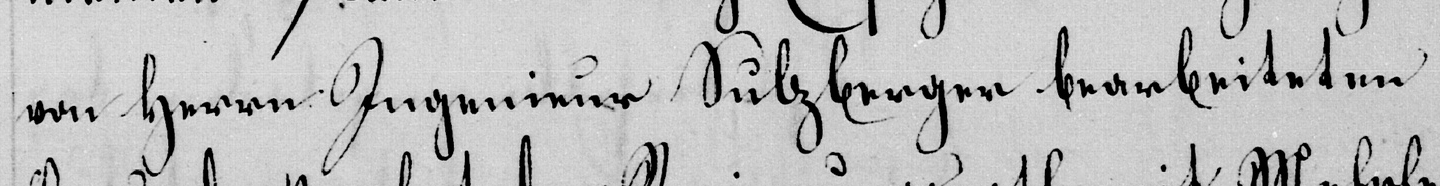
von Herrn Ingenieur Sulzberger bearbeiteten
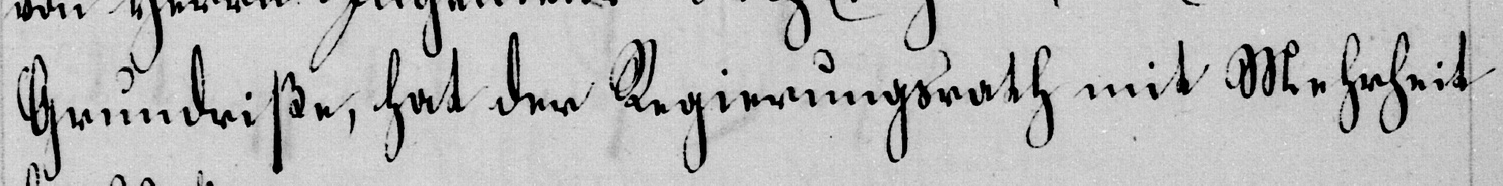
Grundriße, hat der Regierungsrath mit Mehrheit
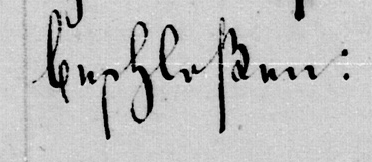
beschloßen:
